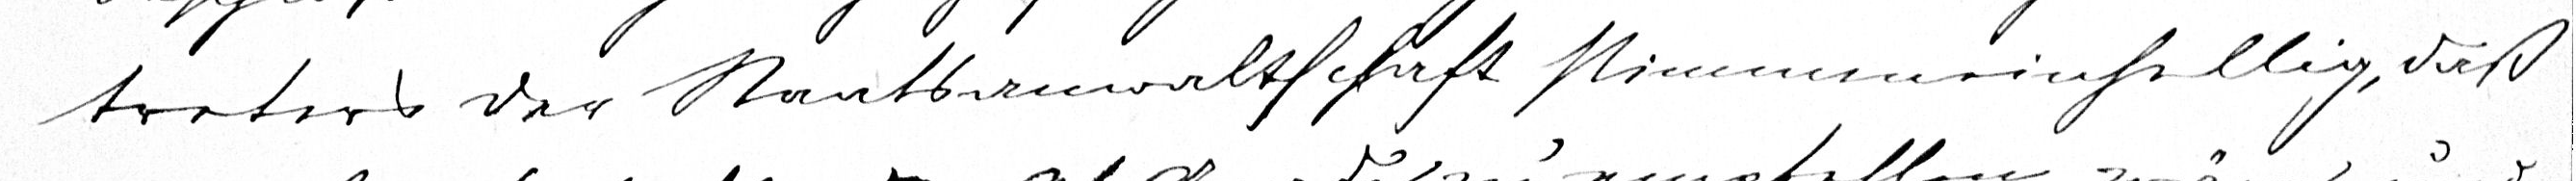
treters der Staatsanwaltschaft stimmeneinhellig, daß
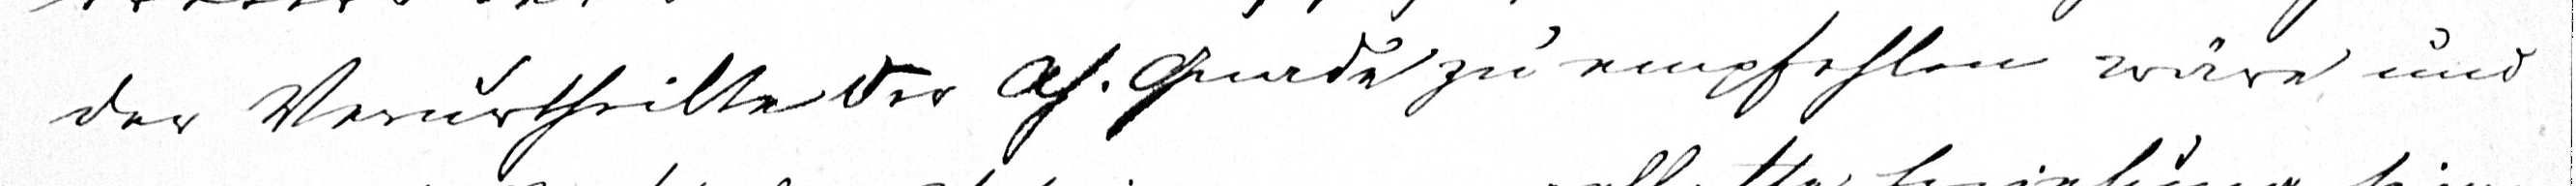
der Verurtheilte der Ah. Gnade zu empfehlen wäre und
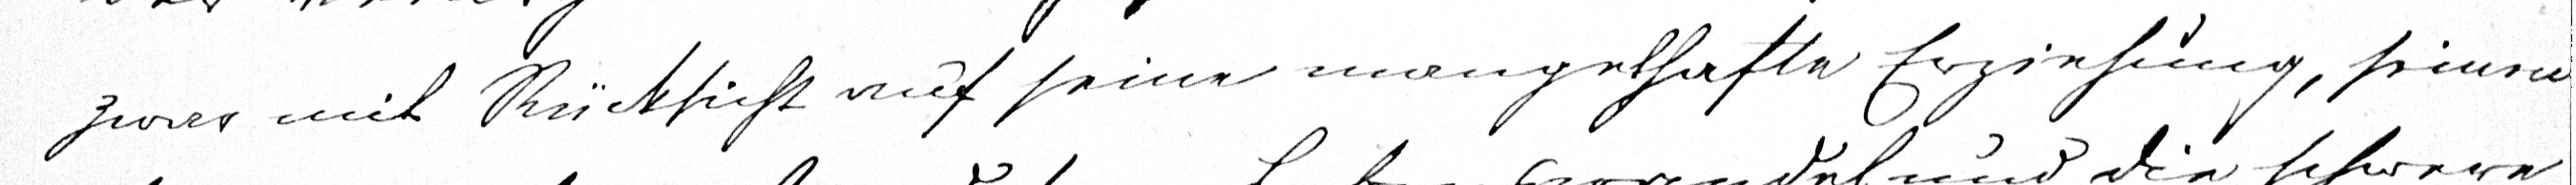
zwar mit Rücksicht auf seine mangelhafte Erziehung, seinen
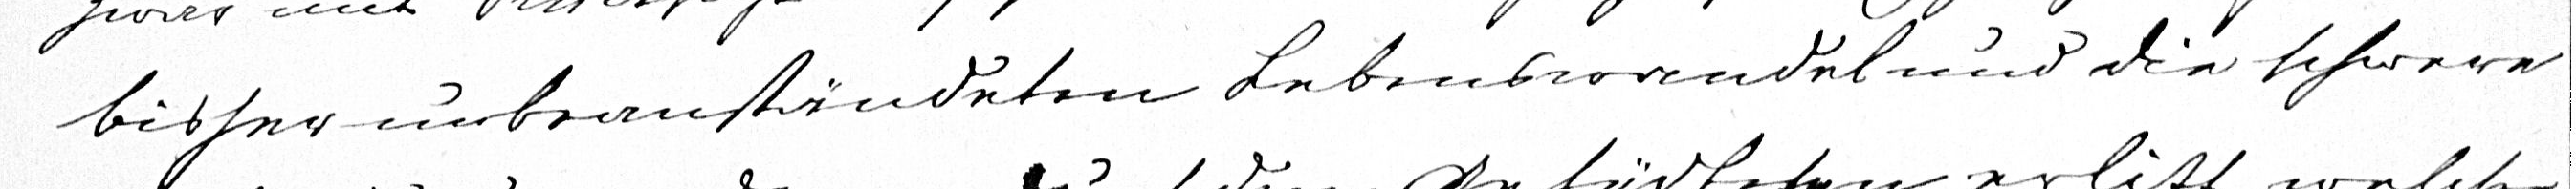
bisher unbranständeten Lebenswandel und die schwere
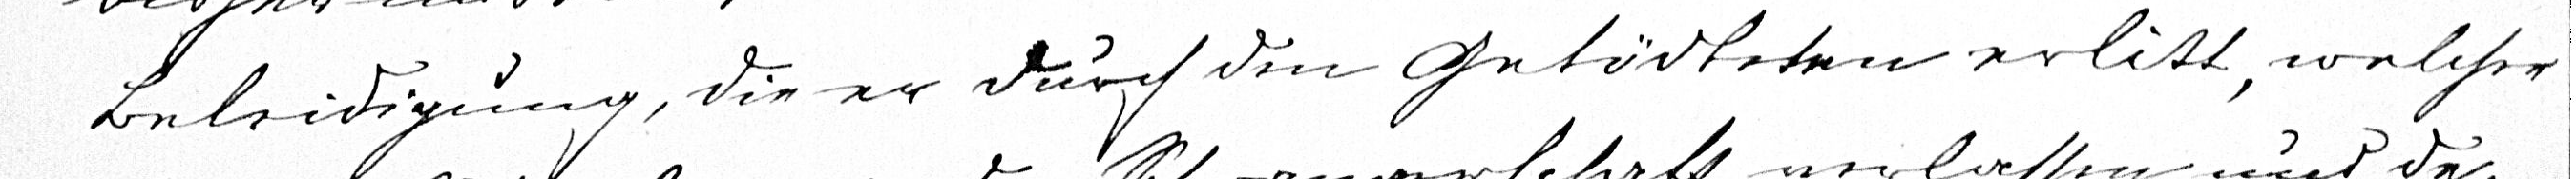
Beleidigung, die er durch den Getödteten erlitt, welcher
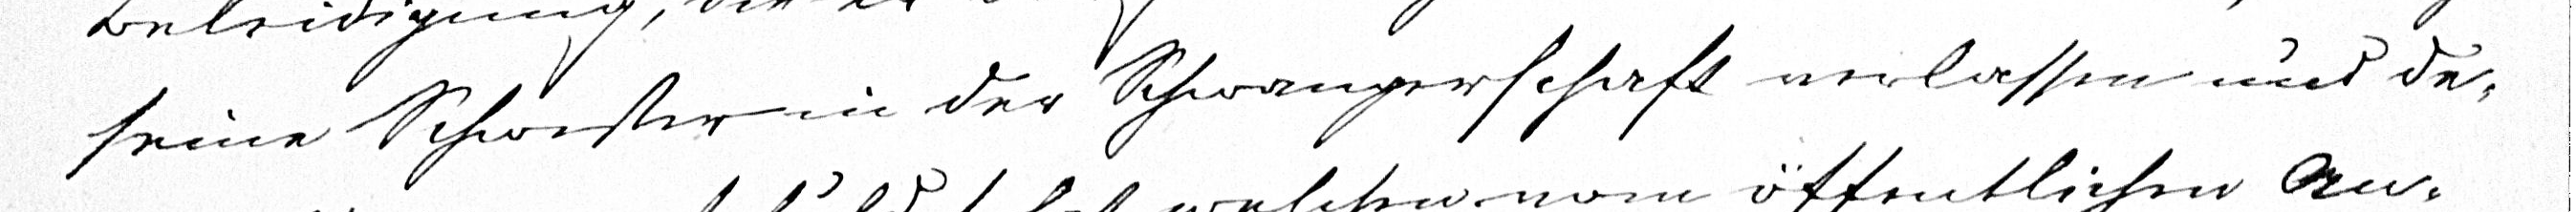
seine Schwester in der Schwangerschaft anlassen und de¬
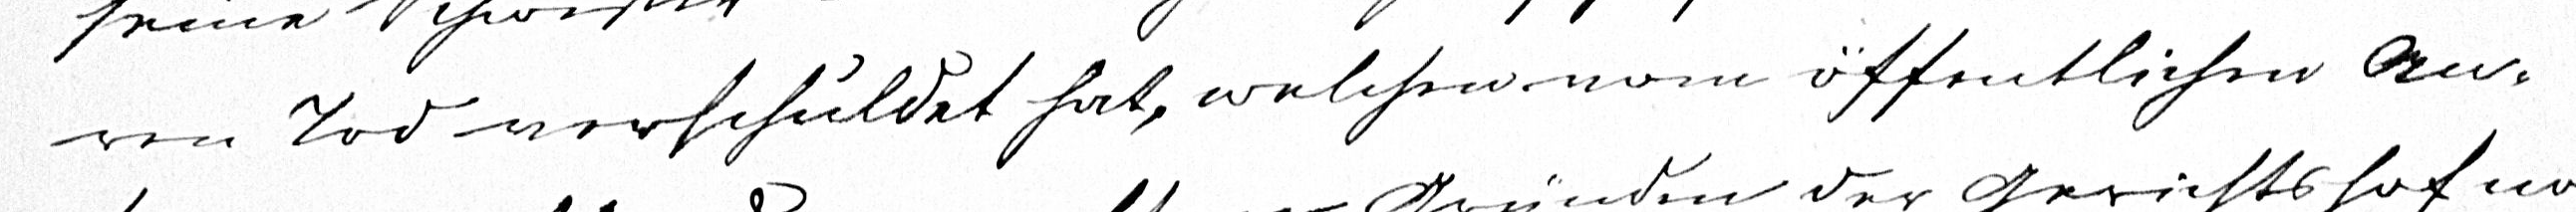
ren Tod vorschuldet hat, welchen vom öffentlichen An¬
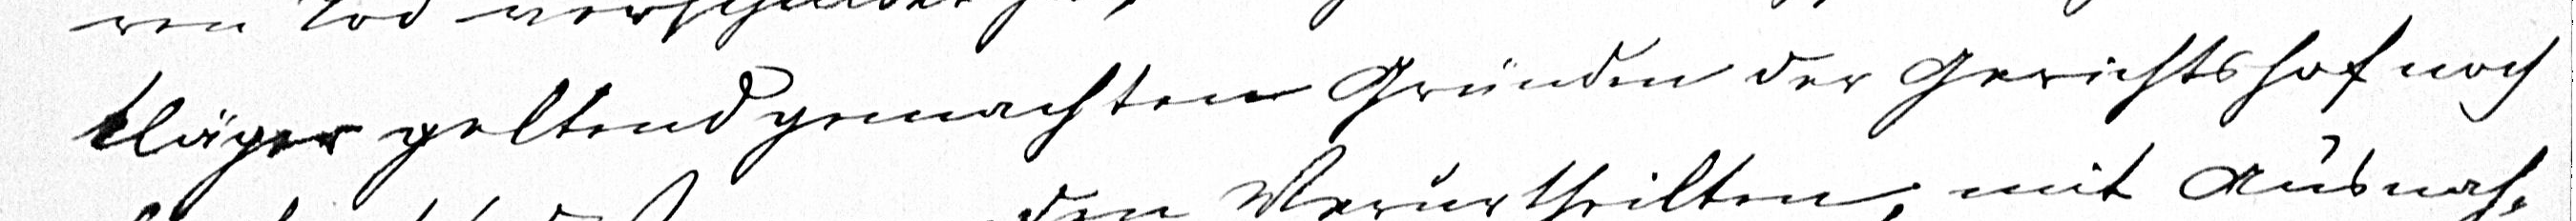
kläger geltend gemachten Gründen der Gerichtshof noch
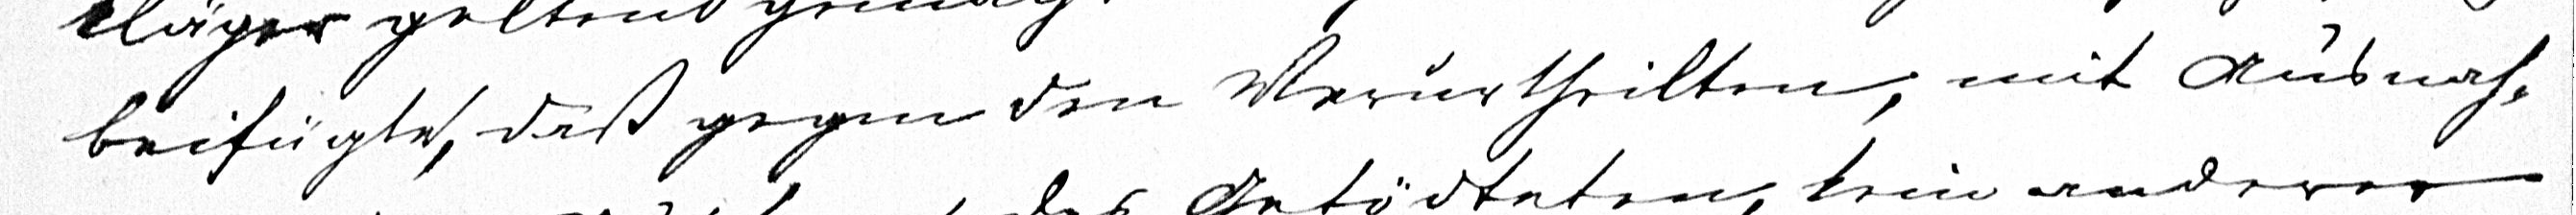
beifügte, daß gegen den Verurtheilten, mit Ausnah¬
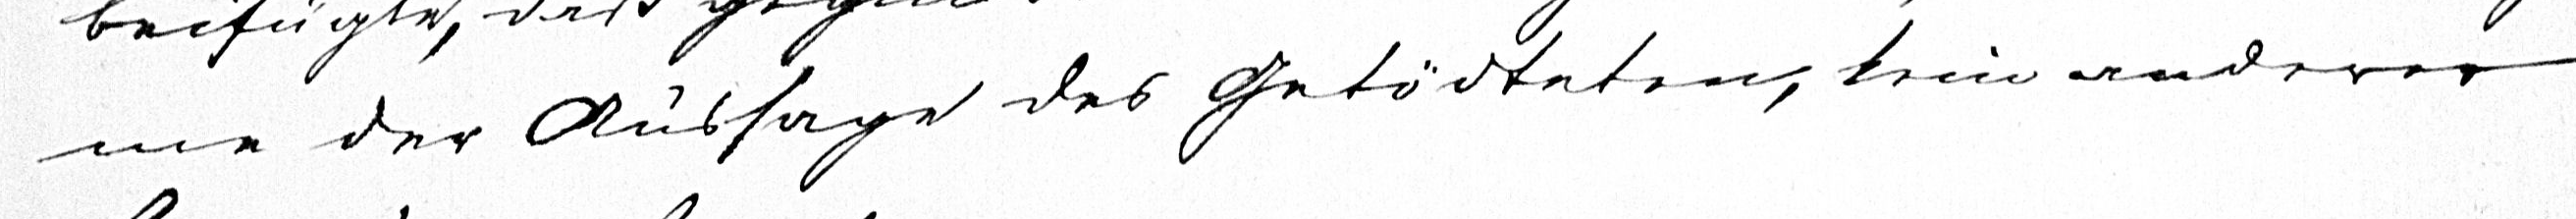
me der Aussage des Getödteten, kein anderer
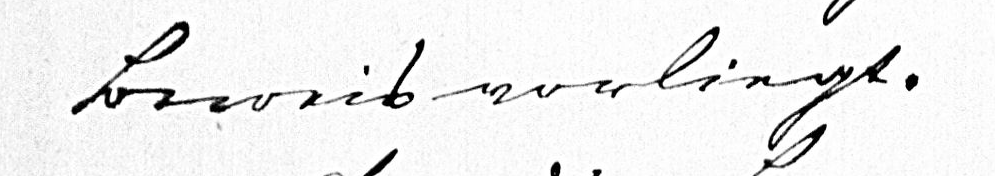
Beweis vorliegt.
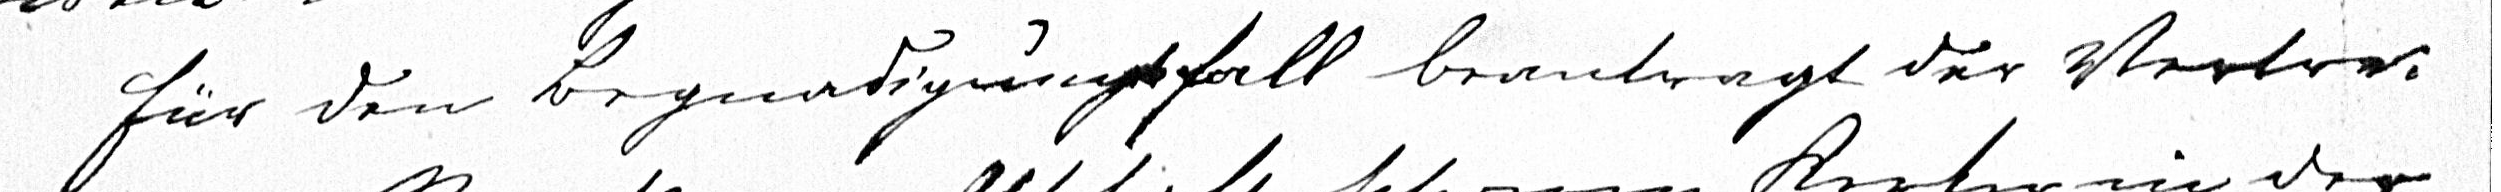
Für den Begnadigungsfall beantragt der Vertre¬
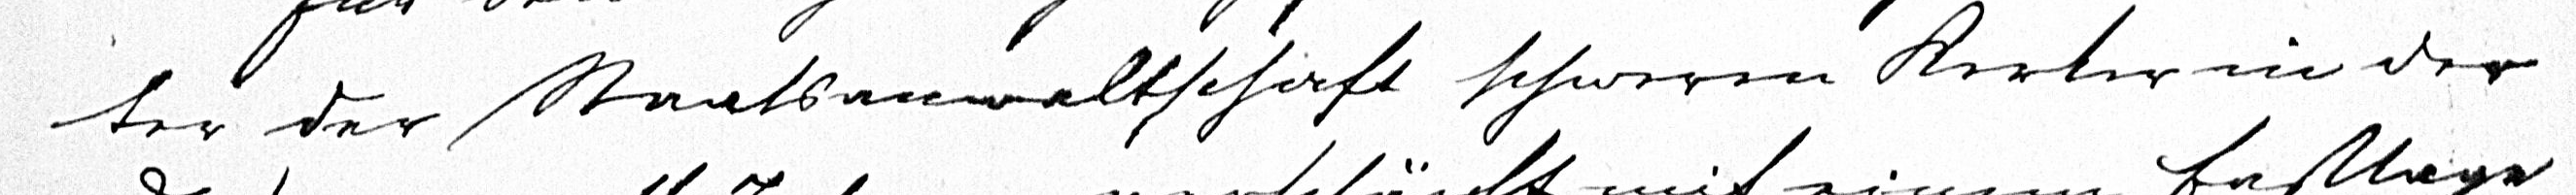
ter der Staatsanwaltschaft schweren Kerker in der
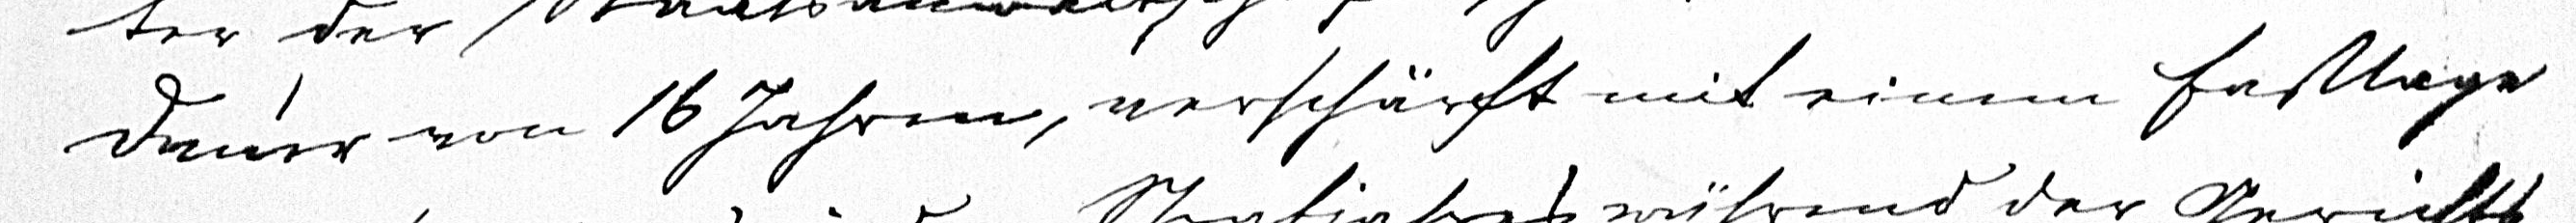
Dauer von 16 Jahren, verschärft mit einem Faxxlage
